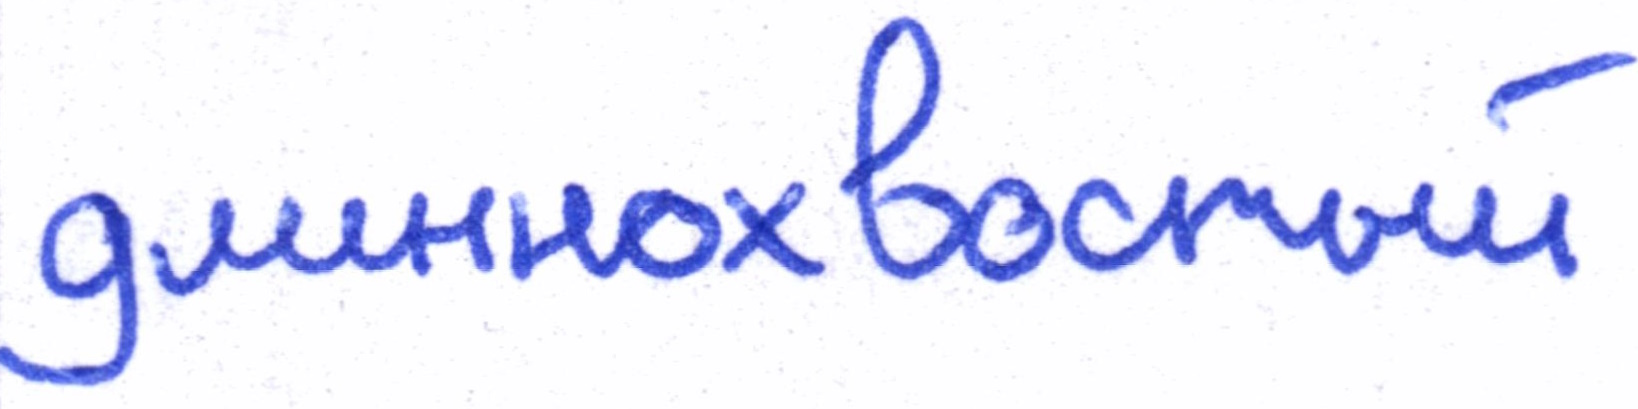длиннохвостый
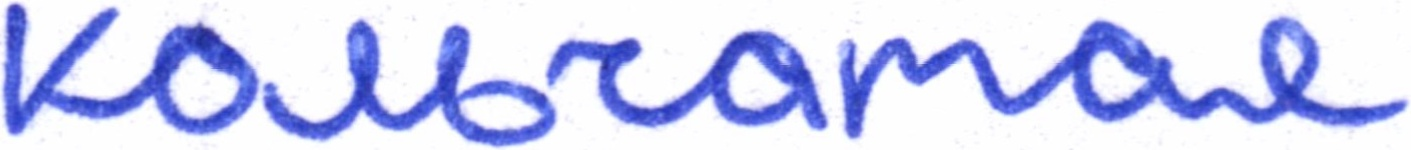кольчатая
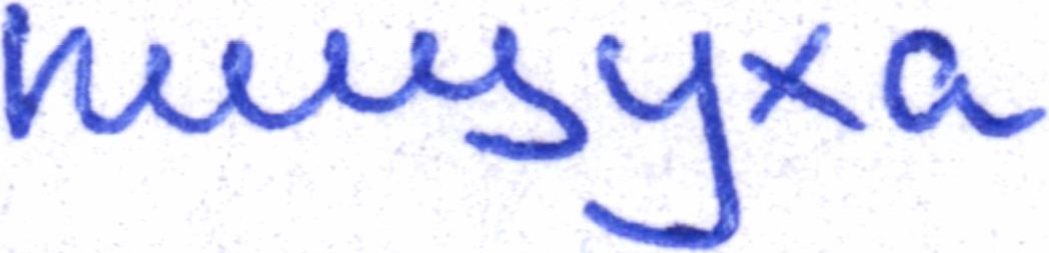пищуха
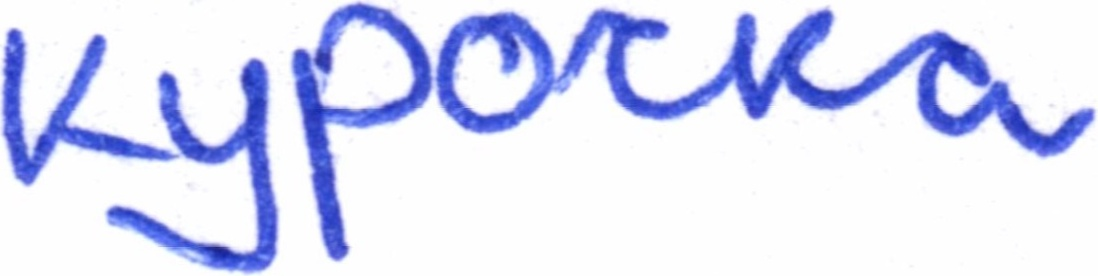курочка
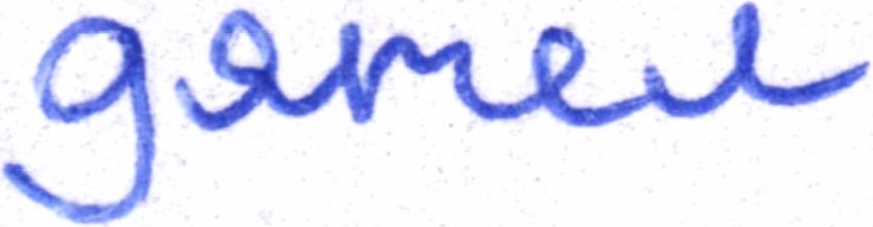дятел
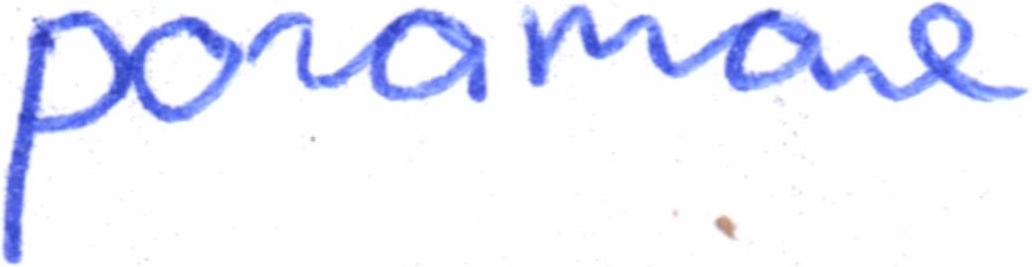рогатая
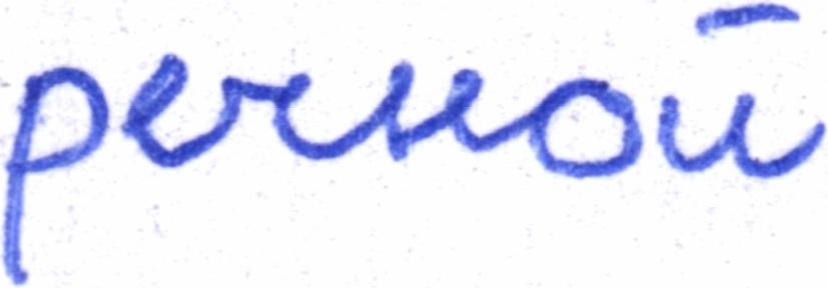речной
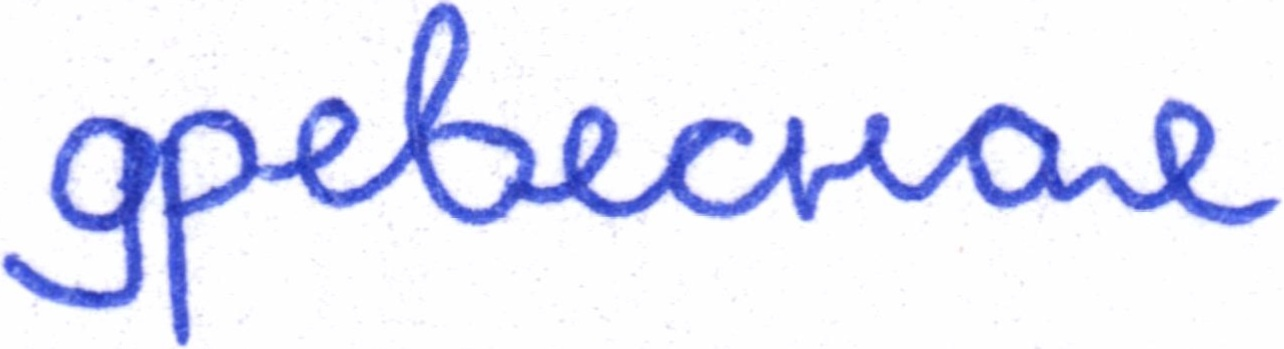древесная
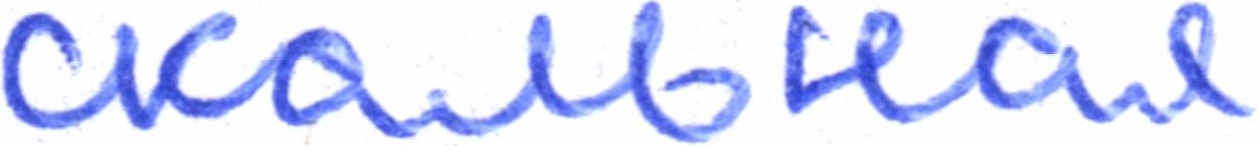скальная
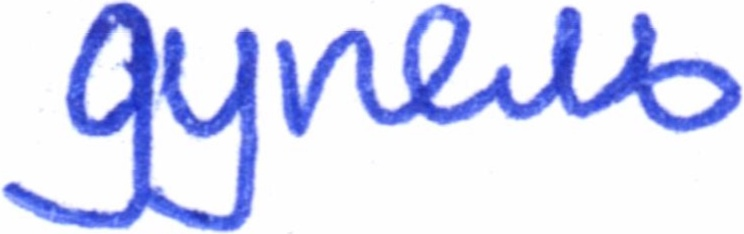дупель
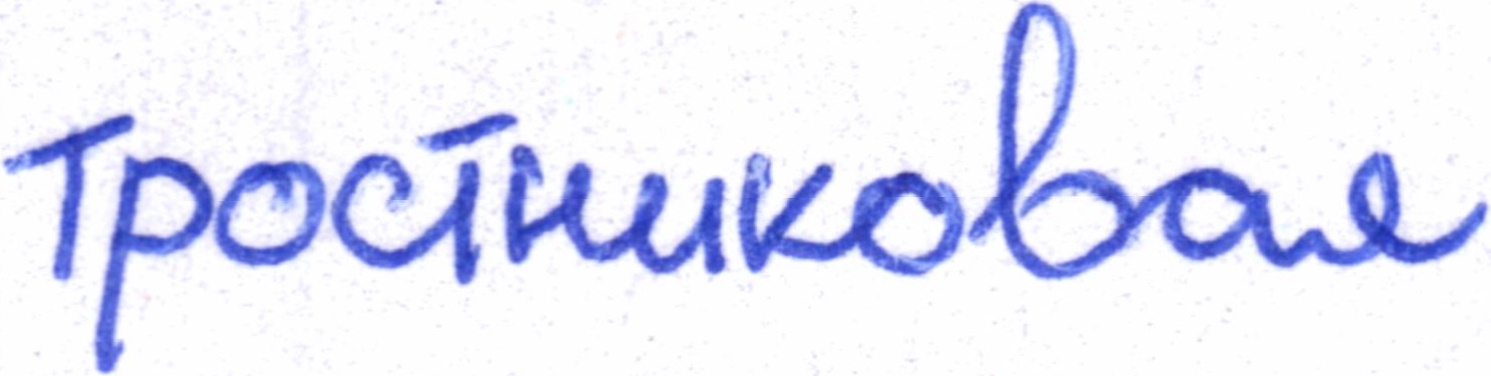тростниковая
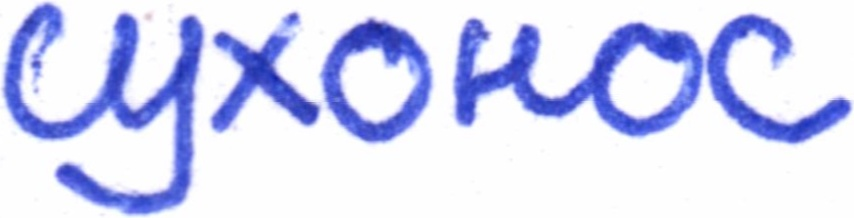сухонос
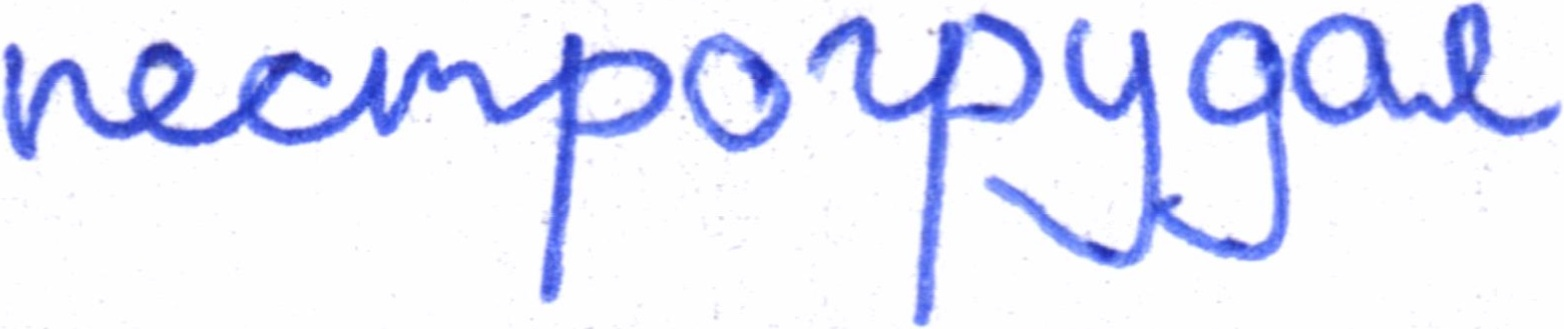пестрогрудая
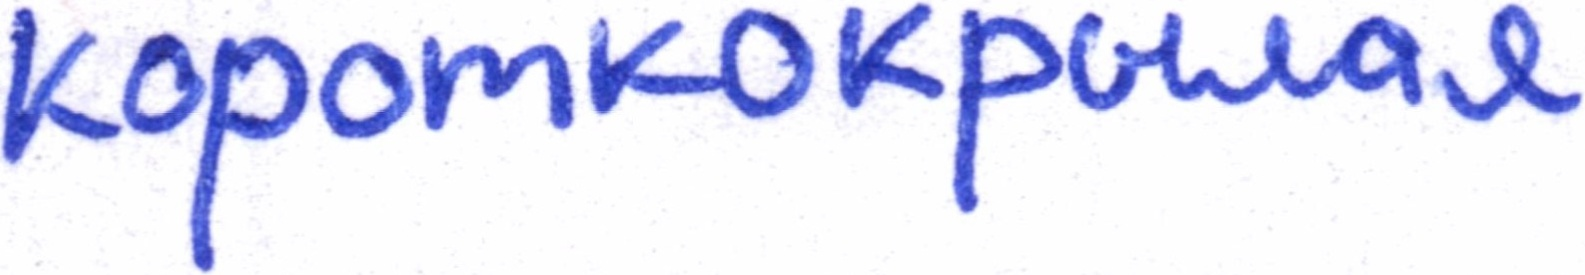короткокрылая
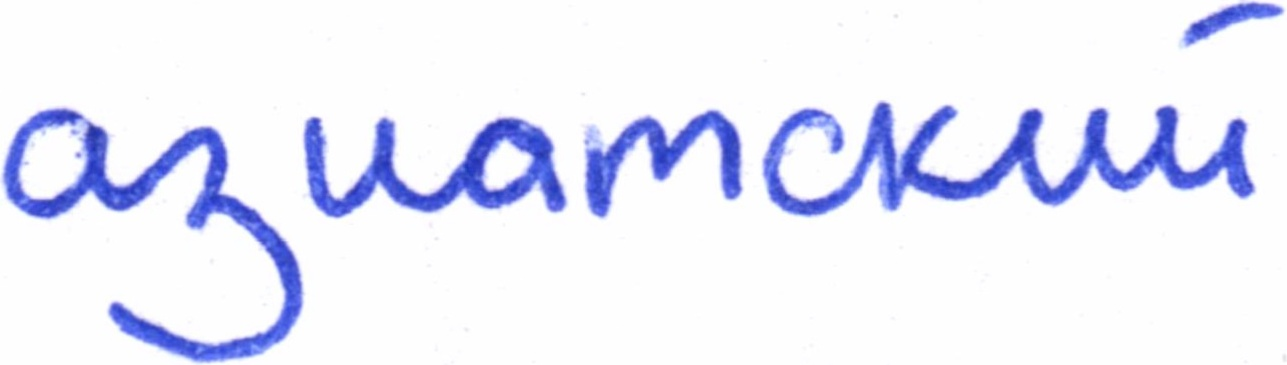азиатский
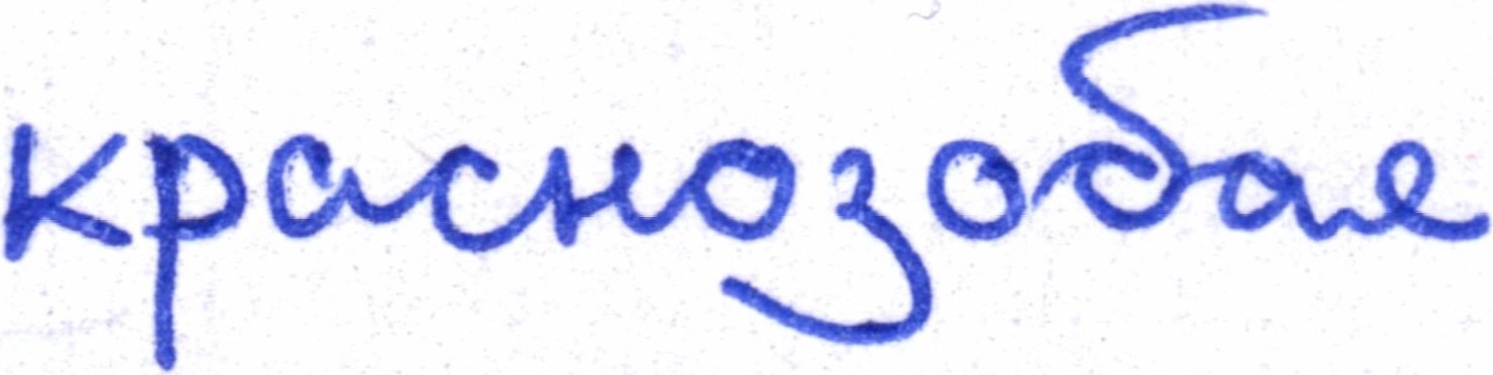краснозобая
